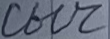сыч
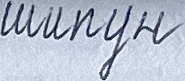шипун
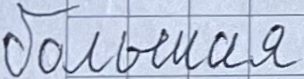большая
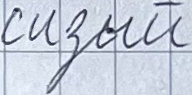сизый
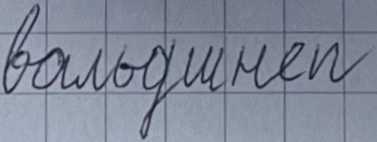вальдшнеп
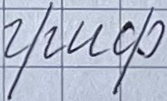гриф
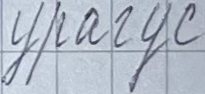урагус
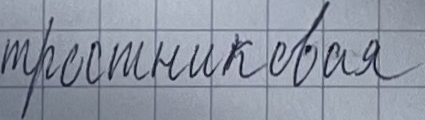тростниковая
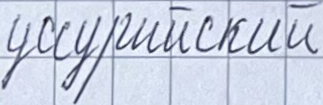уссурийский
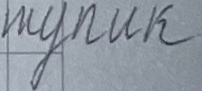тупик
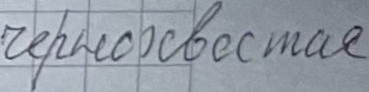чернохвостая
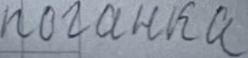поганка
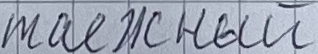таежный
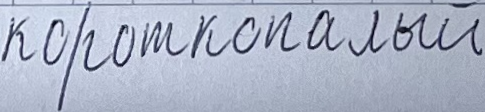короткопалый
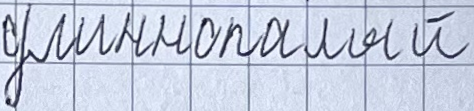длиннопалый
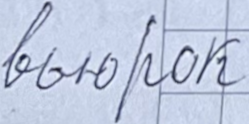вьюрок
